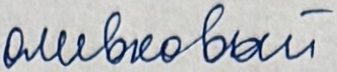оливковый
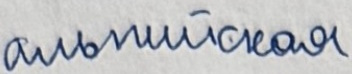альпийская
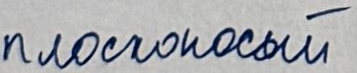плосконосый
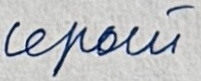серый
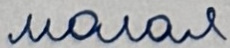малая
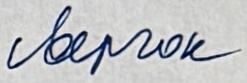сверчок
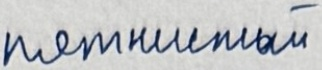пятнистый
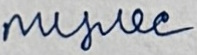тулес
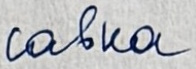савка
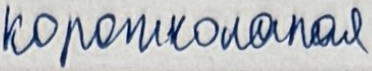коротколапая
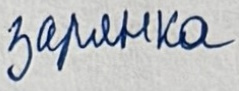зарянка
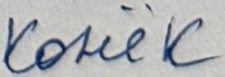конёк
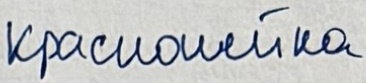красношйка
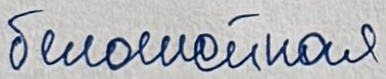белошейная
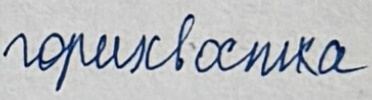горихвостка
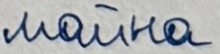майна
